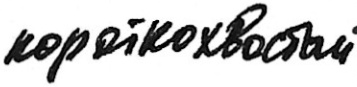короткохвостый
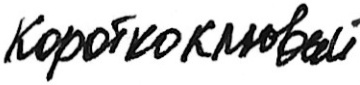короткоклювый
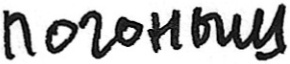погоныш
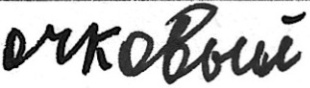очковый
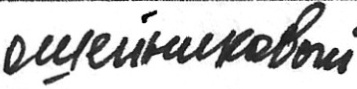ошейниковый
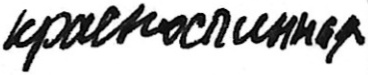красноспинная
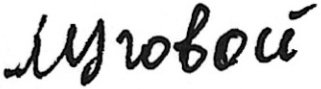луговой
